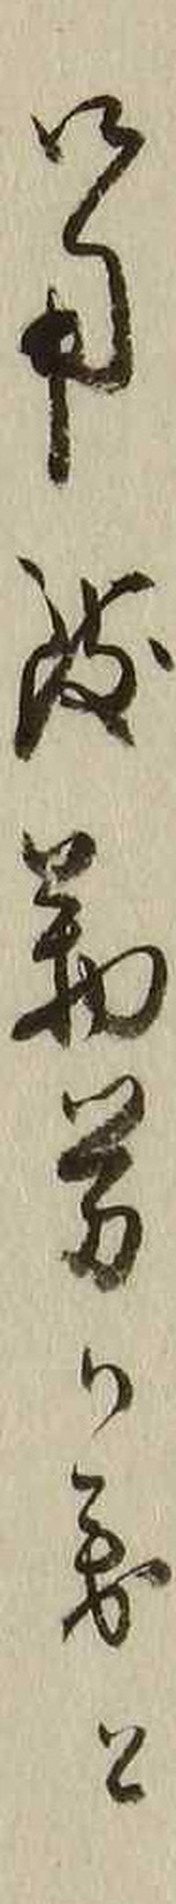御用致勤労候義と
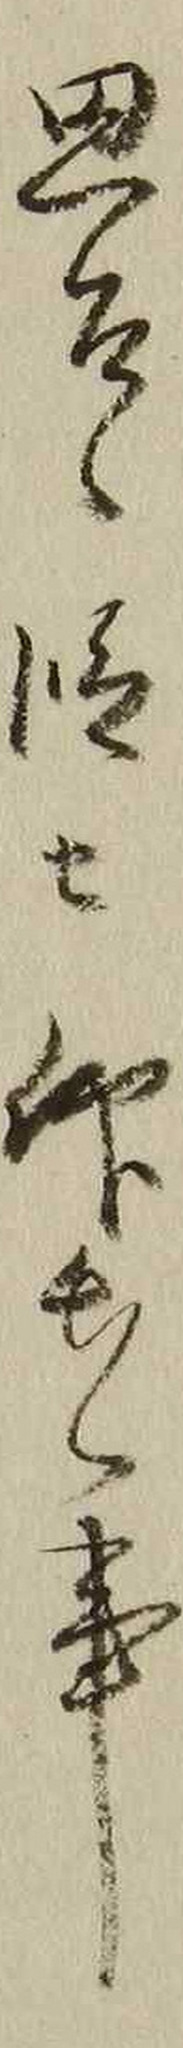思召候段被仰出候事
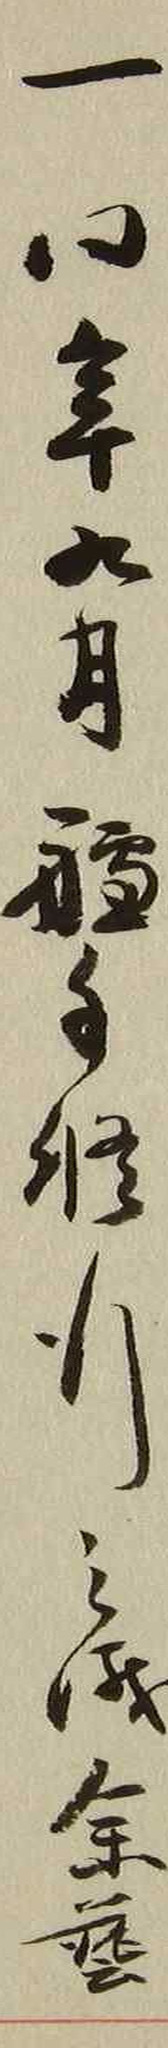一同年九月艫手修行之儀余芸
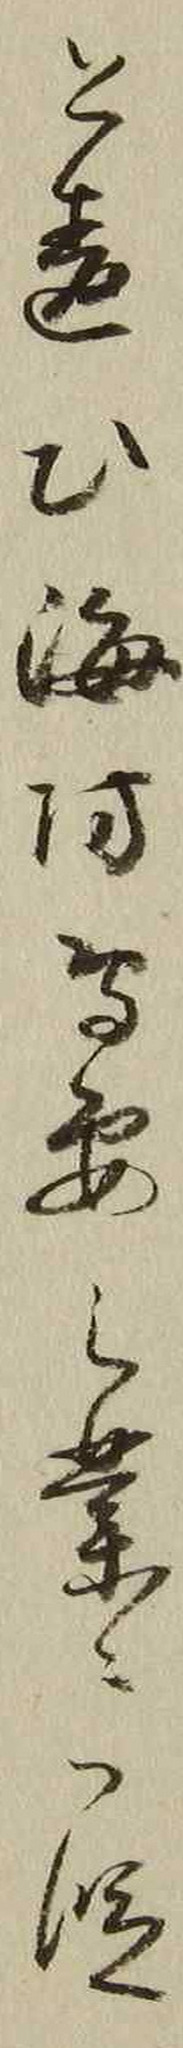と違ひ海防専要之業ニ候段
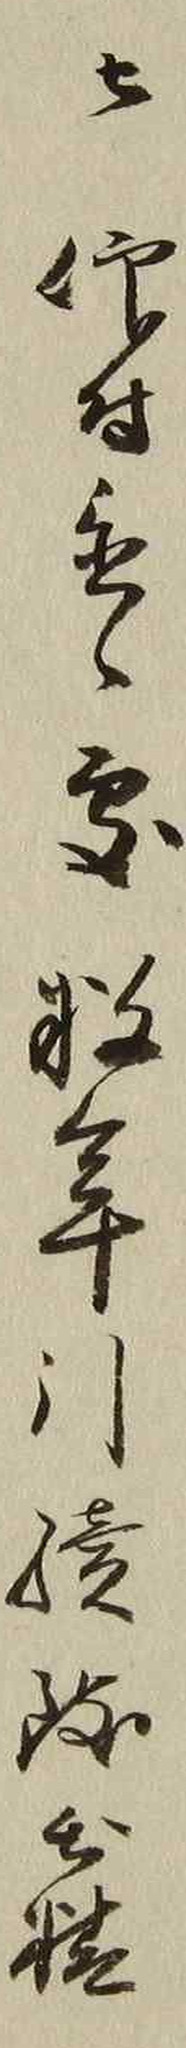被仰付置候処数年引続致出精
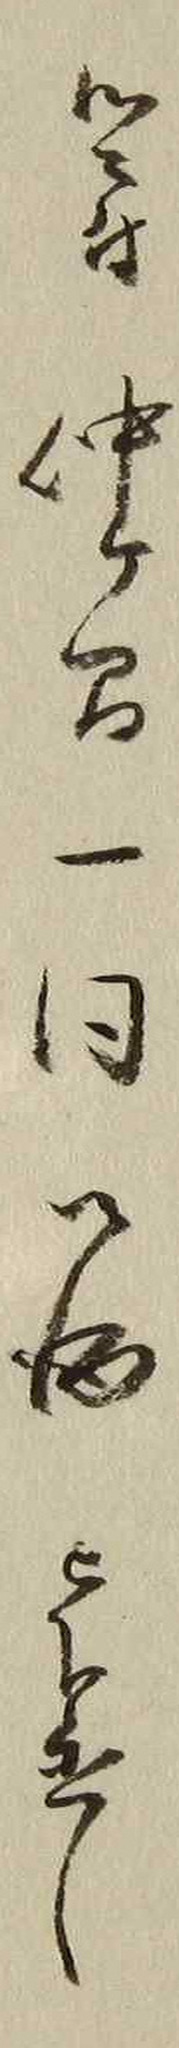候ニ付仲ヶ間一同御酒被下置候
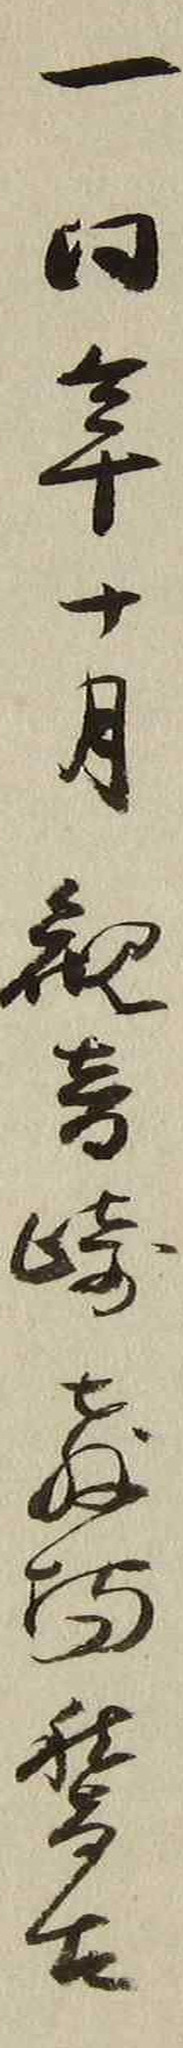一同年十月観音崎教場稽古
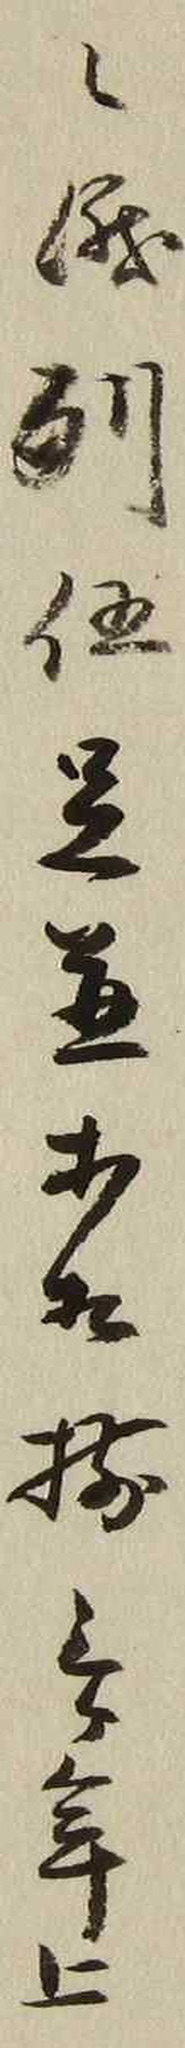之儀列伍足並等相揃三ヶ年上
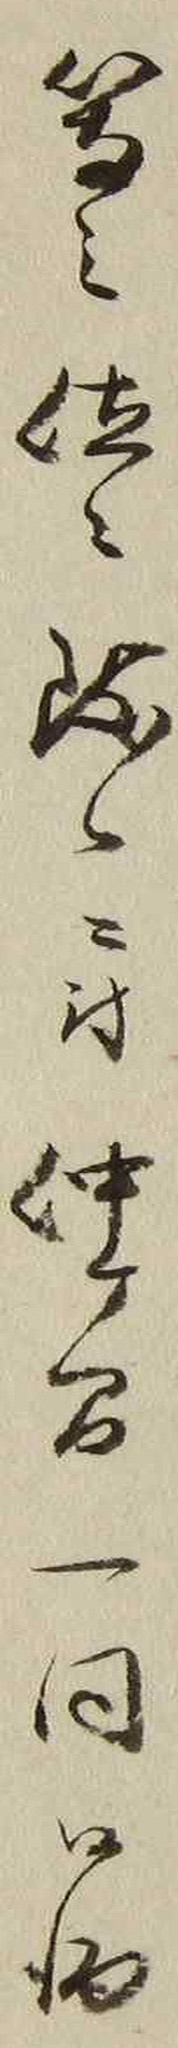等之位ニ致候ニ付仲ヶ間一同御酒
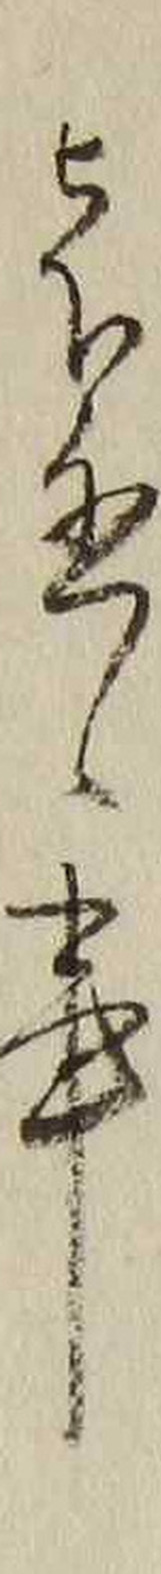被下置候事
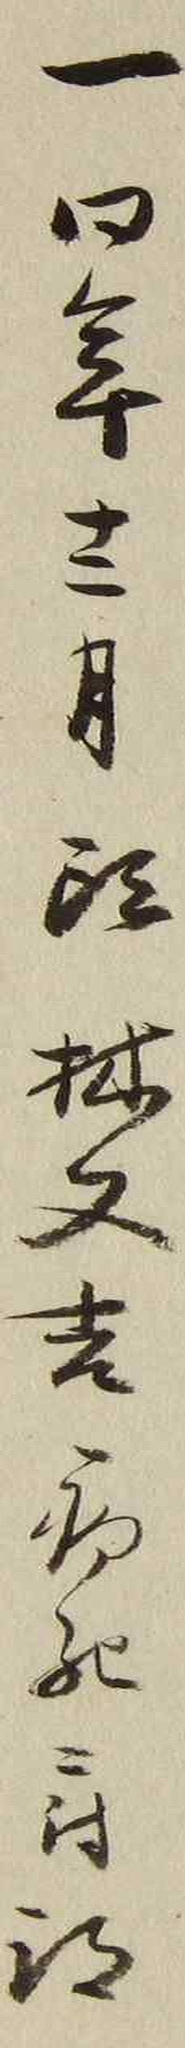一同年十二月頭林又吉病死ニ付跡
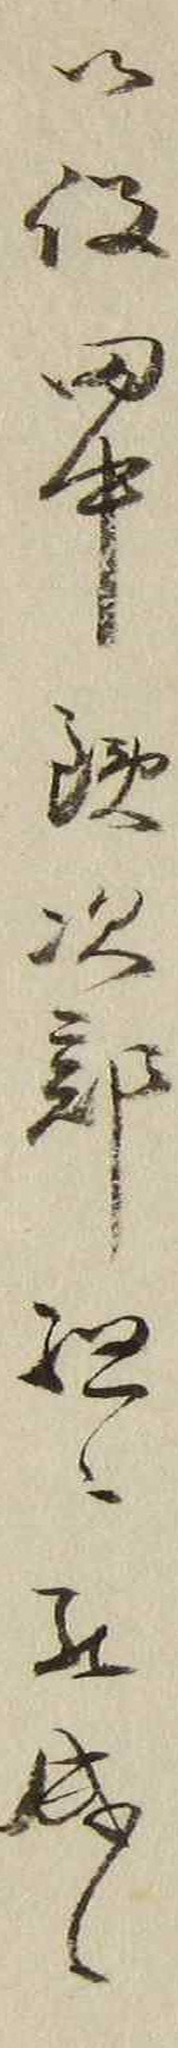御役田中鉄次郎組ニ罷成候

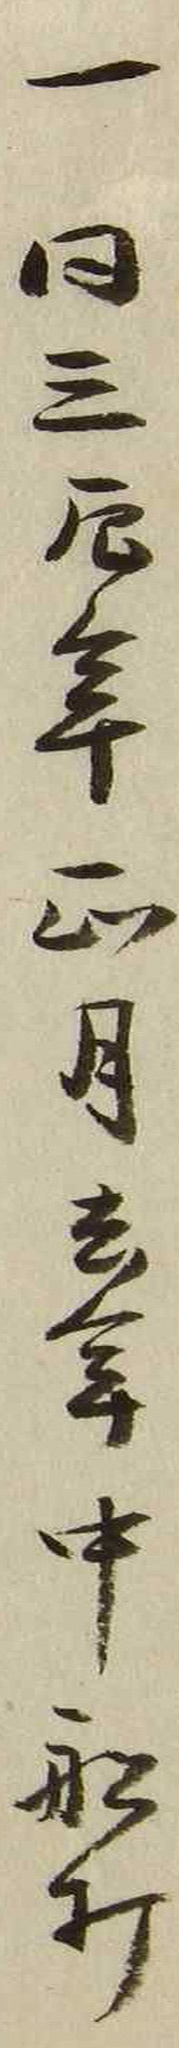一同三辰年正月去年中船打
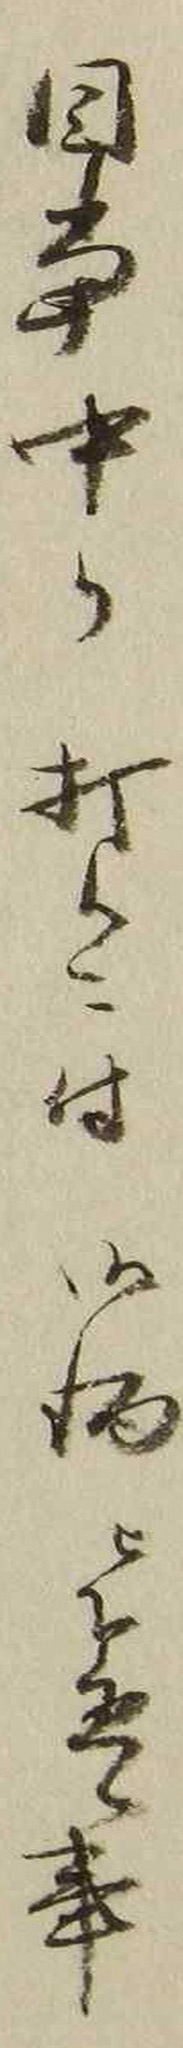目当中り打候ニ付御酒被下置候事
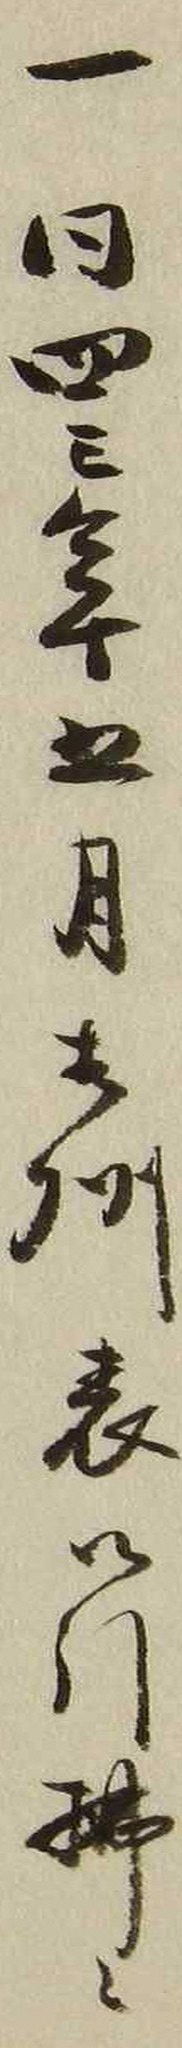一同四巳年五月相州表御引払ニ
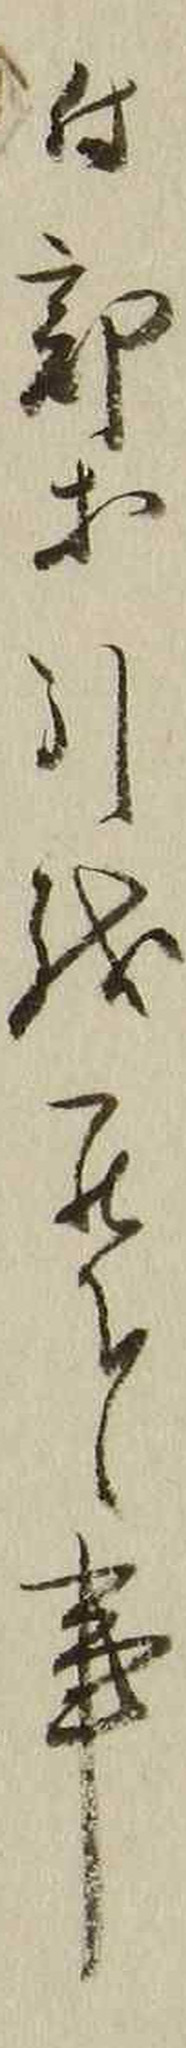付郎等引越罷下候事
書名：諸士系譜　巻之288　さ之部20
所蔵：会津若松市立会津図書館
